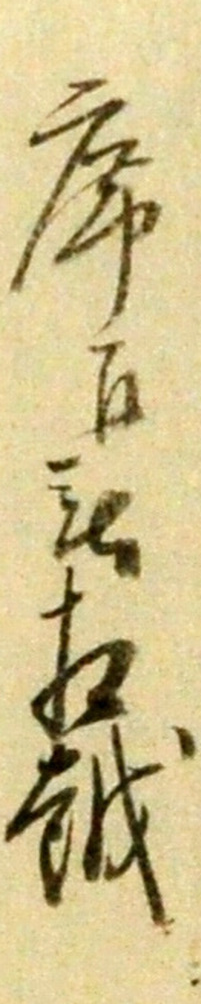席え被相越
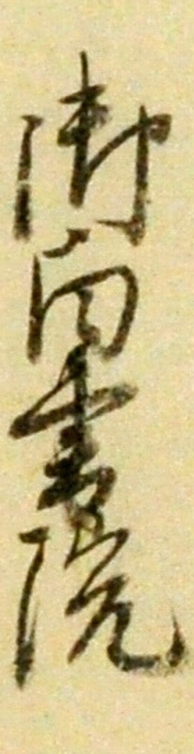御白書院

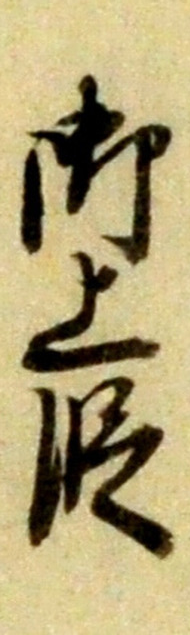御上段
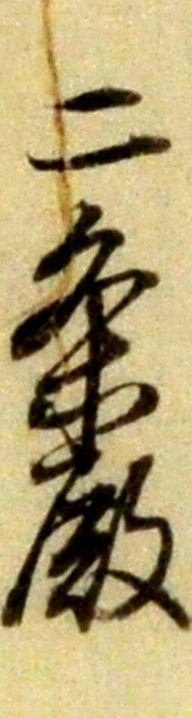二条殿
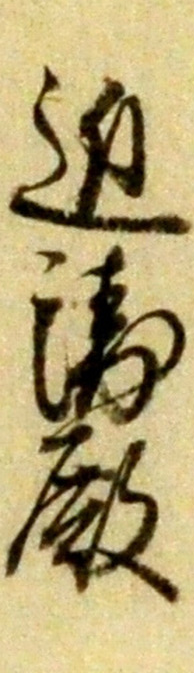近衛殿
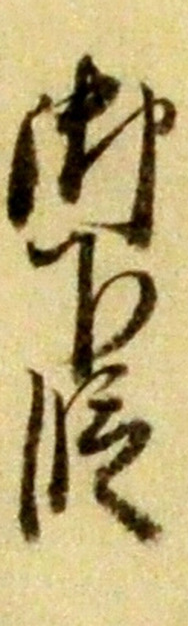御下段
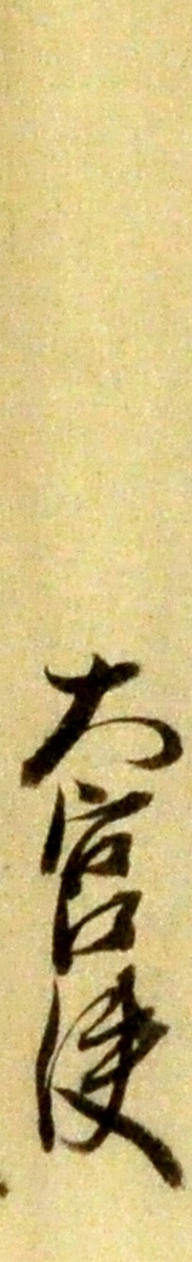大宮使
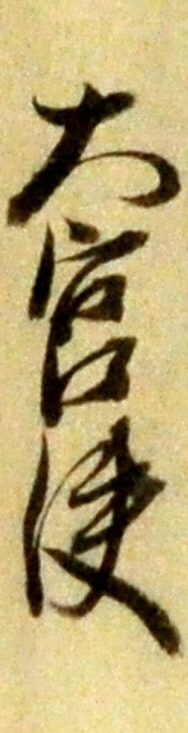大宮使
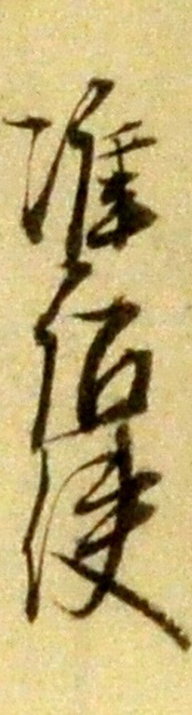准后使
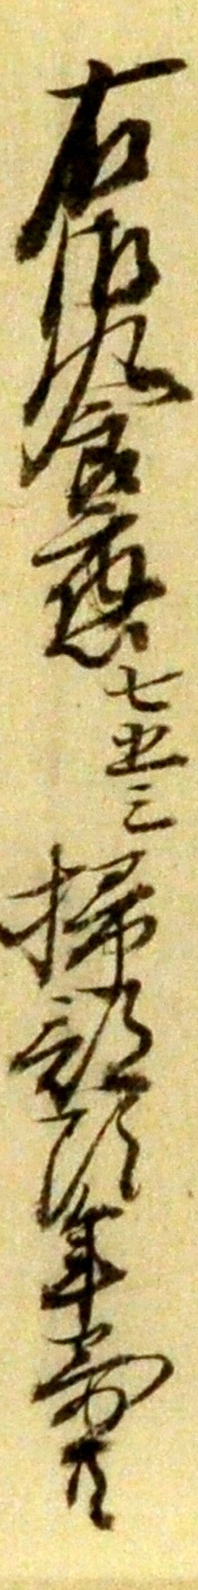右御饗応七五三掃部頭年寄共
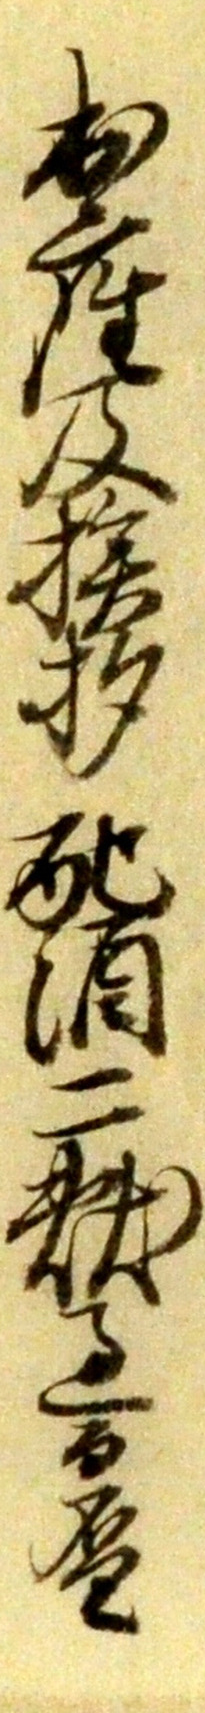出座及挨拶配酒二献過而盃
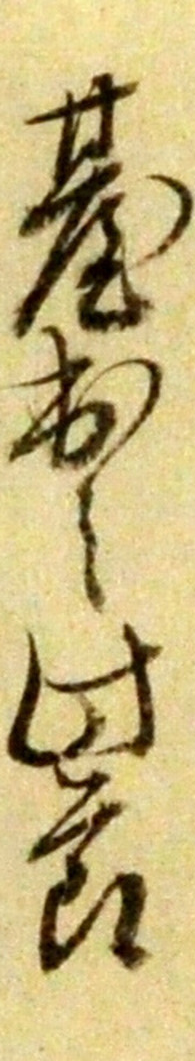台出之此節
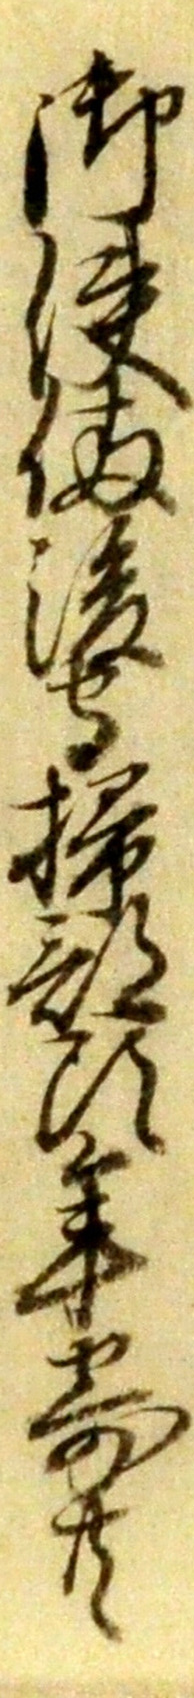御使備後守掃部頭年寄共
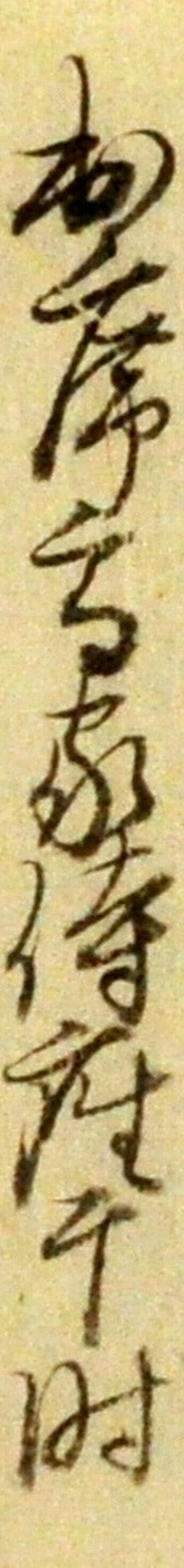出席高家侍座于時
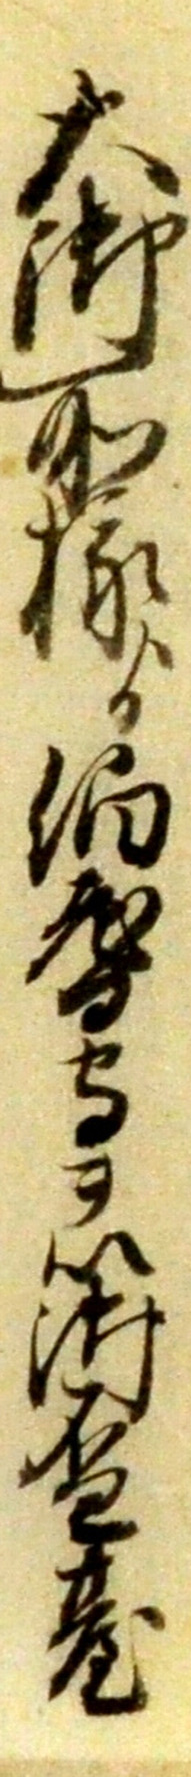大御所様ゟ伯耆守ヲ以御盃台
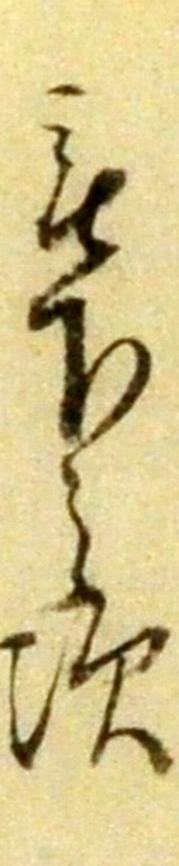被下之次
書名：御馳走御能ノ節ノ留外
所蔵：伊那市立高遠町図書館・合同会社AMANE
